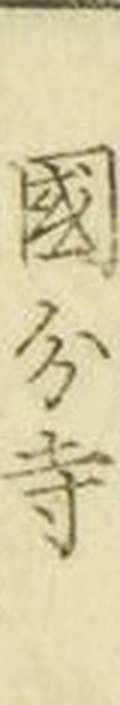国分寺
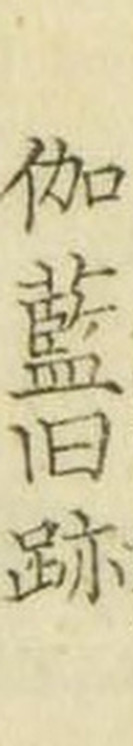伽藍旧跡
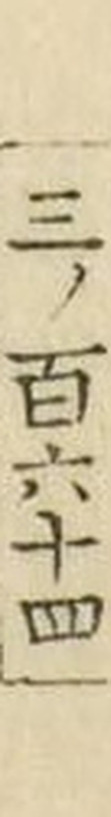三ノ百六十四

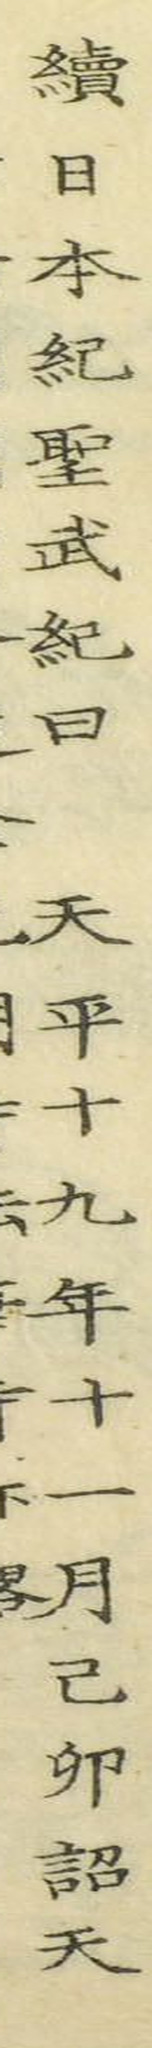続日本紀聖武紀曰天平十九年十一月己卯詔天
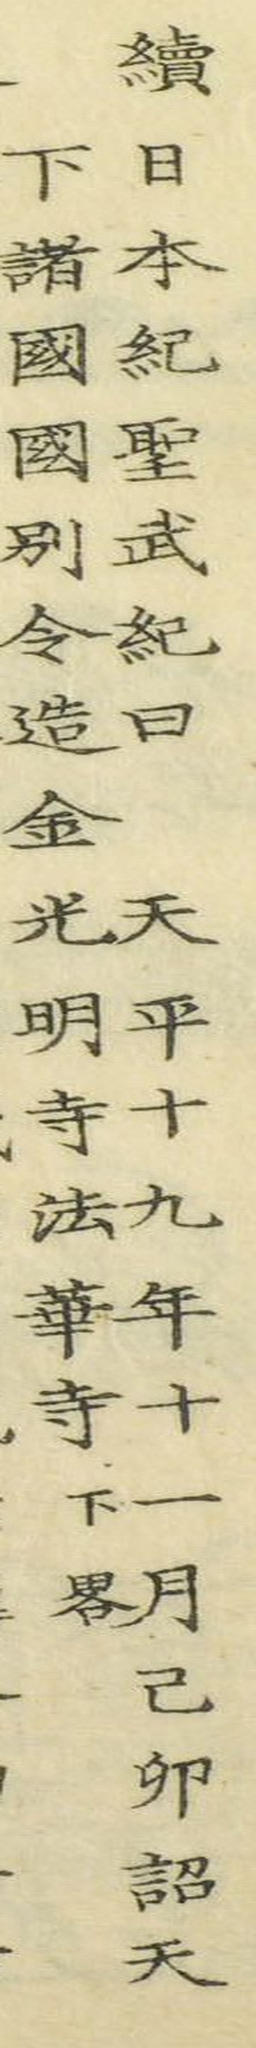下諸国国別令造金光明寺法華寺下畧
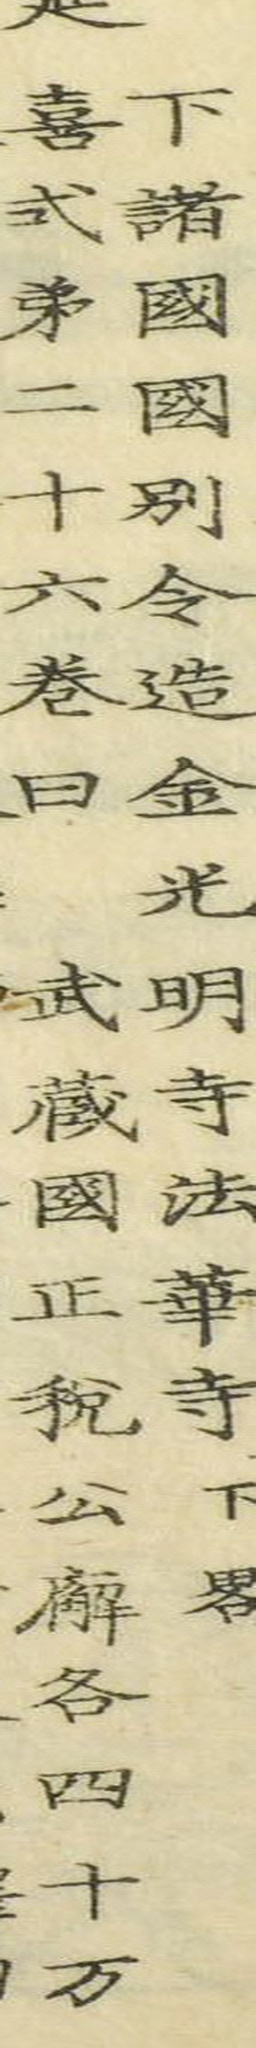延喜式弟二十六巻曰武蔵国正税公廨各四十万
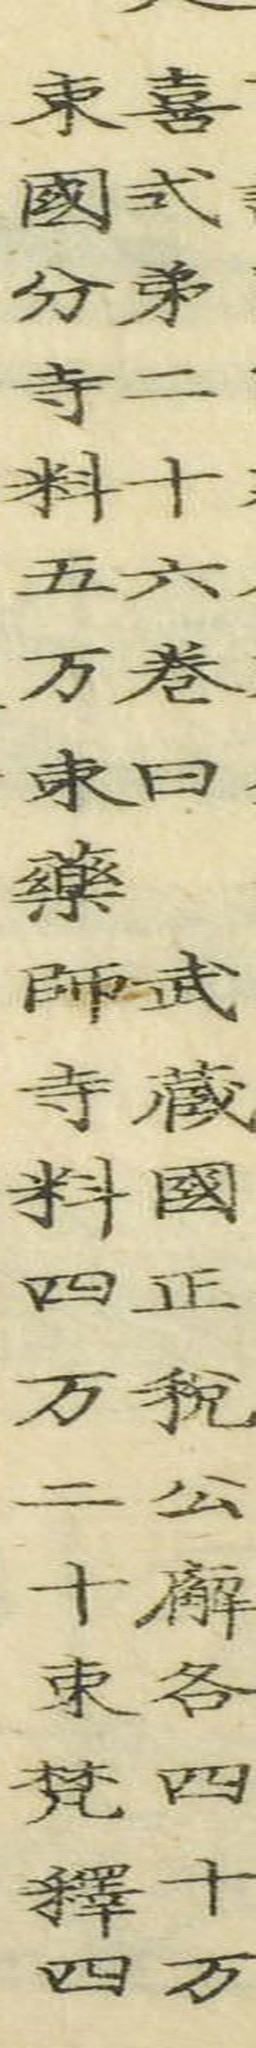束国分寺料五万束薬師寺料四万二十束梵釈四
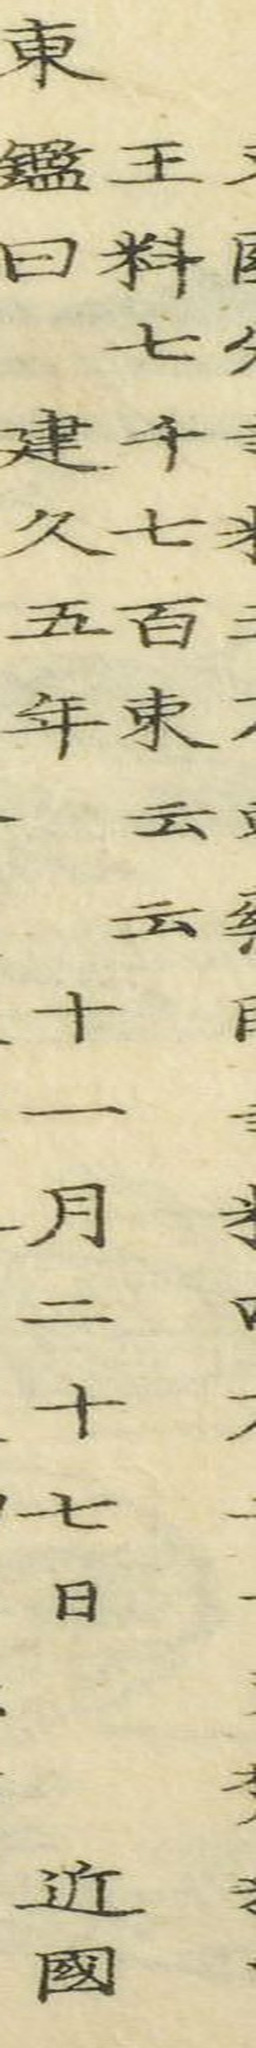東鑑曰建久五年十一月二十七日近国
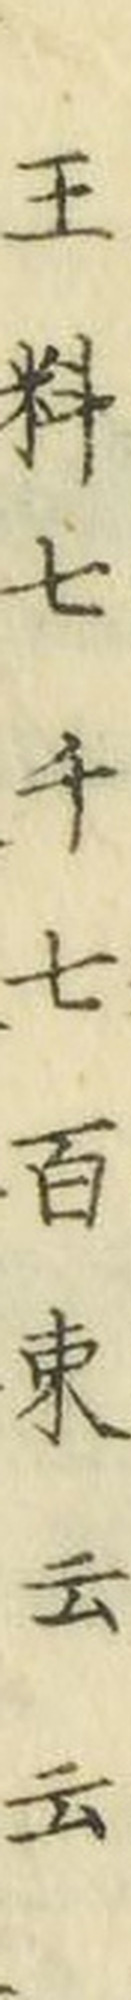王料七千七百束云々
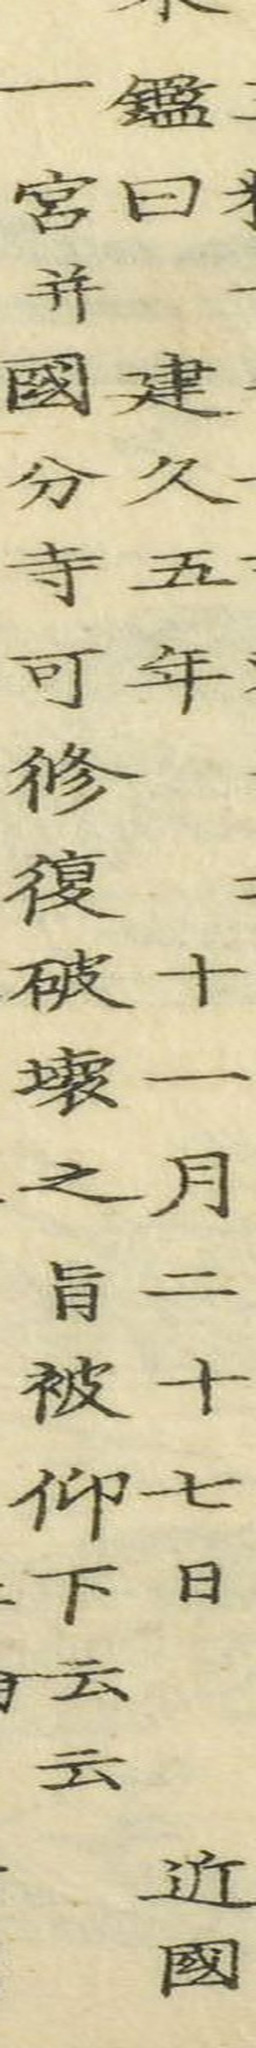一宮并国分寺可修復破壊の旨被仰下云々
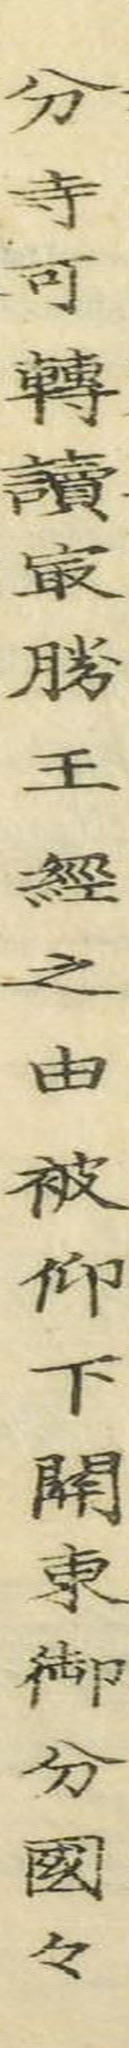分寺可転読最勝王経之由被仰下関東御分国々
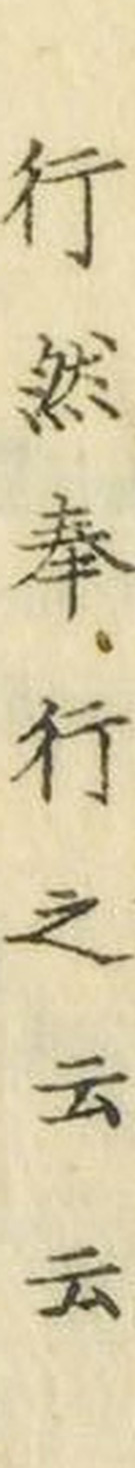行然奉行之云々
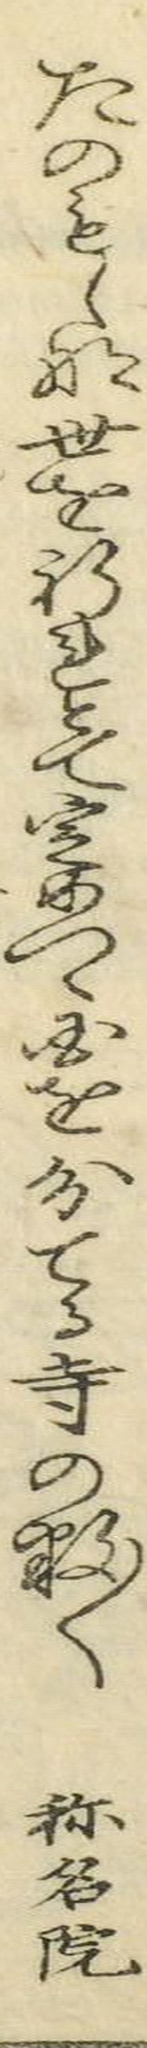たのもしな世を祈れとて定めつゝ国を分てる寺の数〳〵称名院
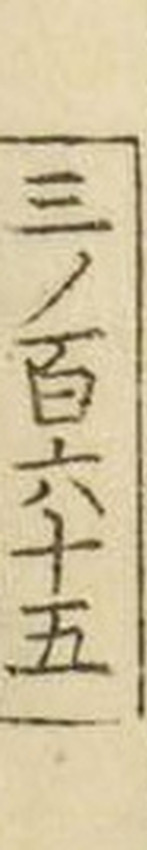三ノ百六十五
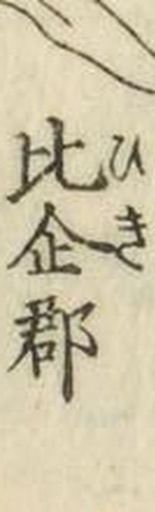比企郡

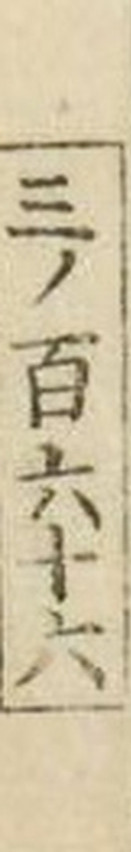三ノ百六十六
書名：江戸名所図会 20巻 巻之9
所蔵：東京学芸大学教育コンテンツアーカイブ
